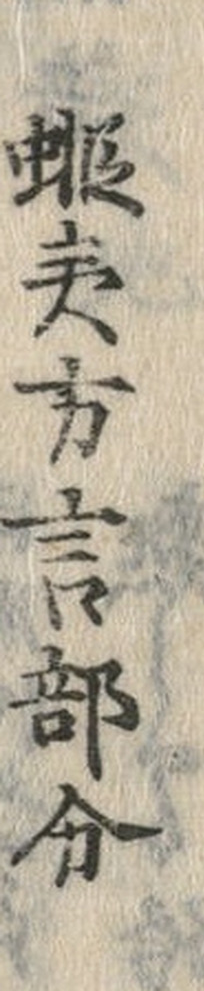蝦夷方言部分
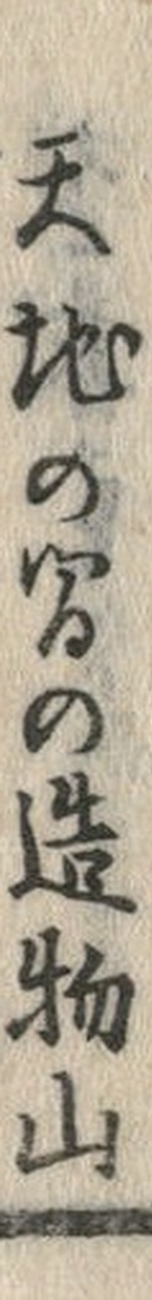天地の間の造物山
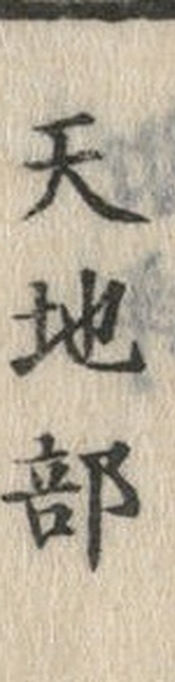天地部
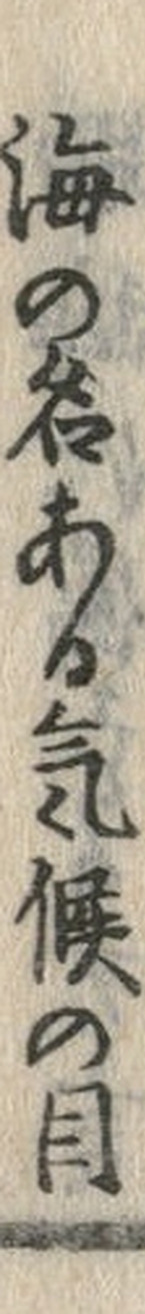海の名ある気候の目
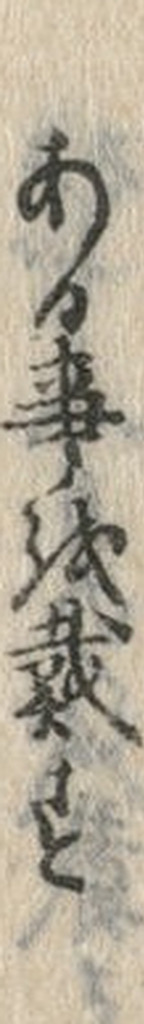ある事を戴す
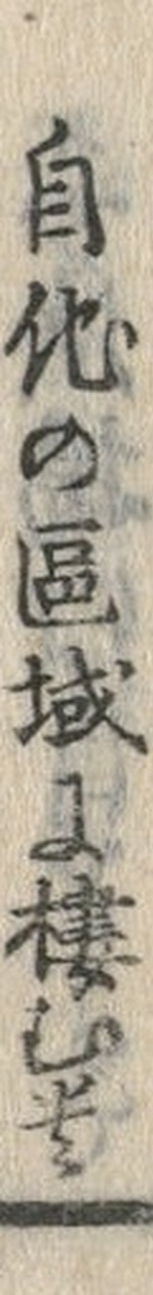自他の区域に棲む貴
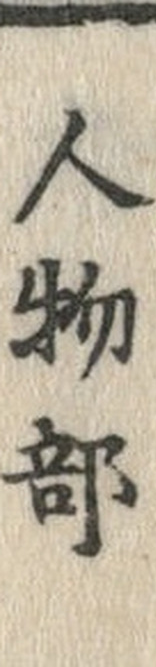人物部
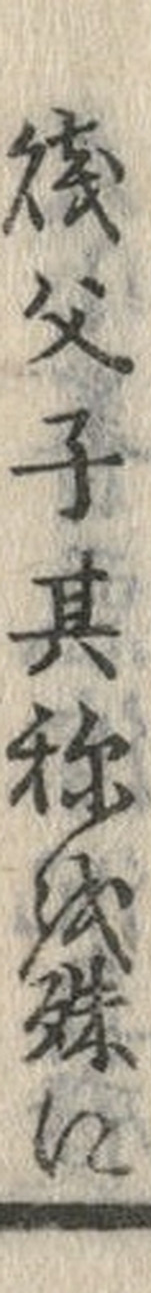賎父子其称を殊に
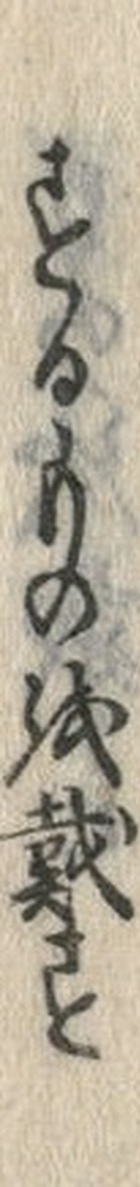するものを戴す
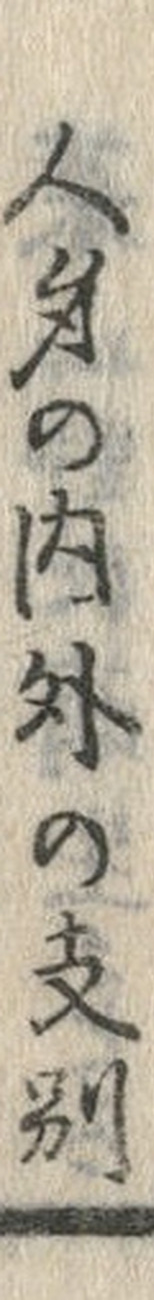人身の内外の支別
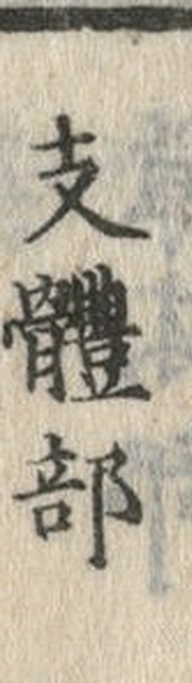支体部
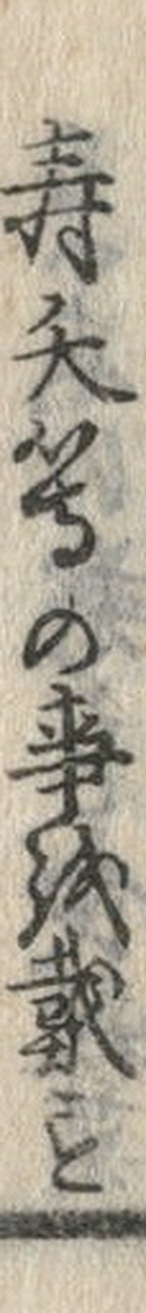寿夭等の事を戴す
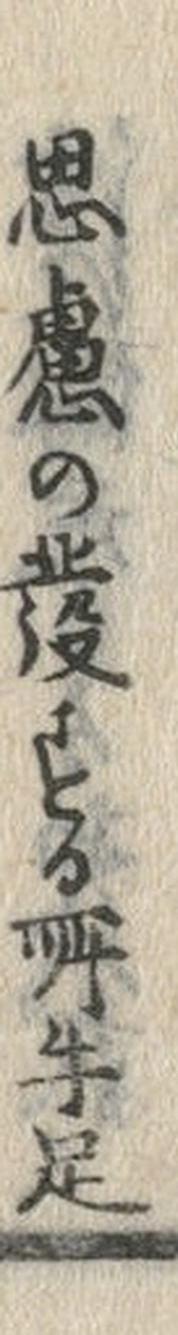思慮の発する所手足
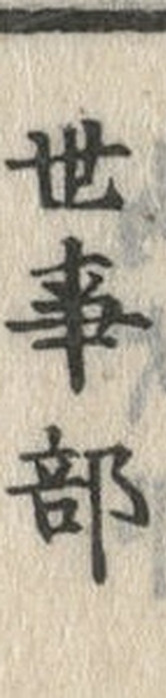世事部
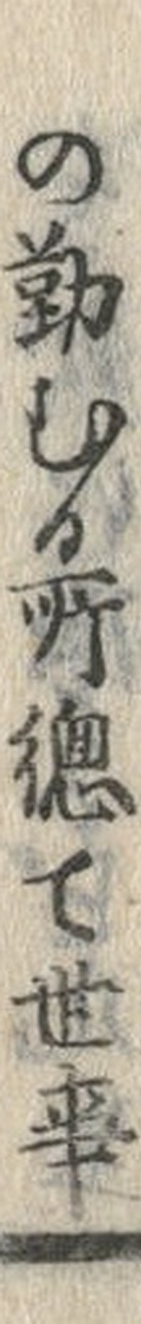の勤しむる所総て世事
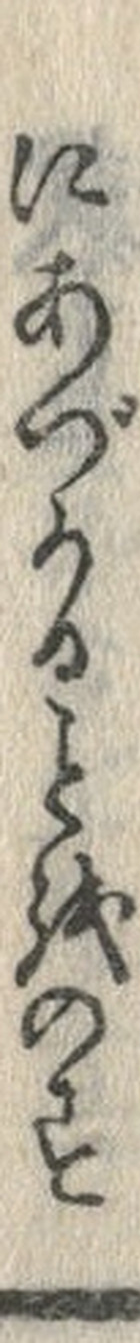にあづかることをのす
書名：蝦夷方言藻汐草　乾巻
